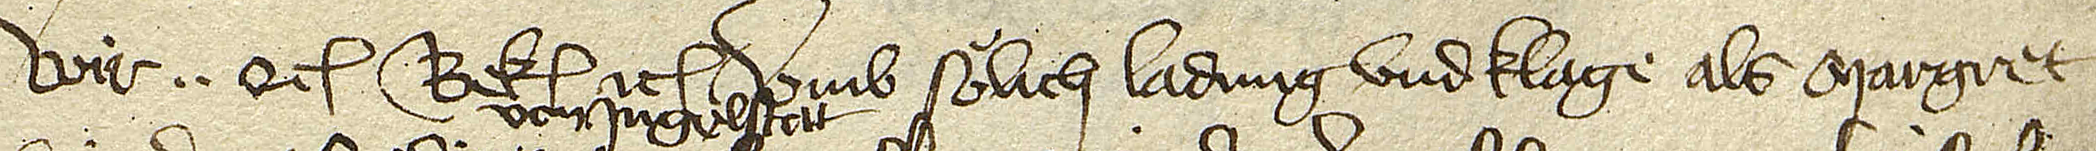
Wir ~ ec* Bek* ec* / Vmb ſölich ladung vnd klage als Margret
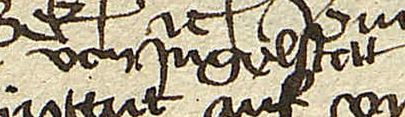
von Ingelſtat
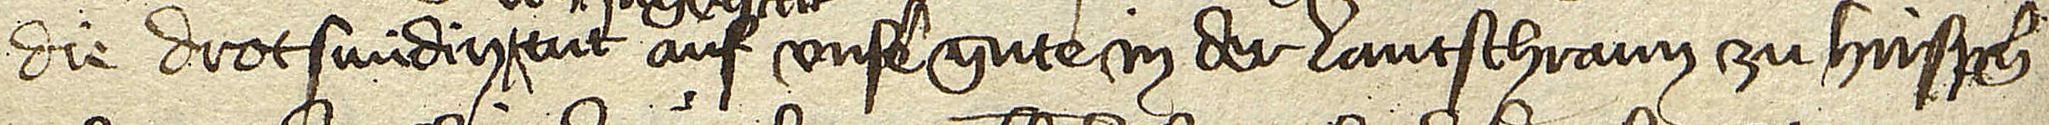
die drotſmidin tut auf vnſ*e gute in der lantſchrann cʒu hirſpg*
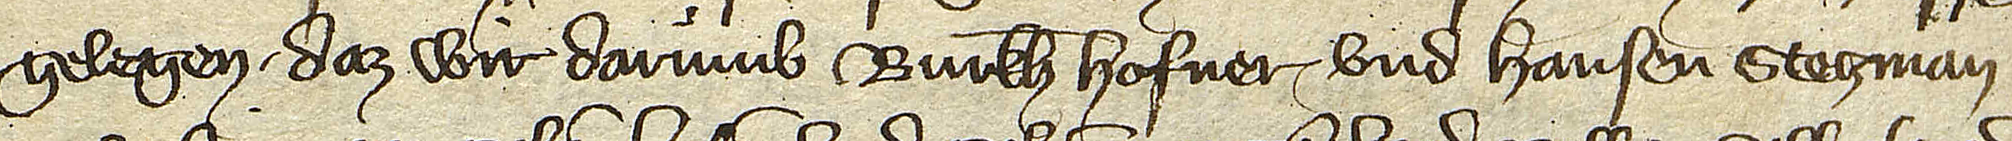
gelegen / daʒ wir darümb Burkh* hofner vnd hanſen Stecʒman
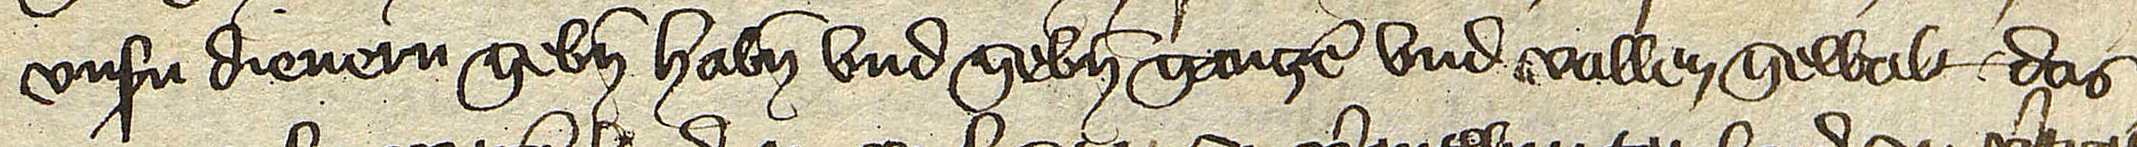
vnſ*n dienern gebn* habn* vnd gebn* gancʒe* vnd vollen gewalt / das
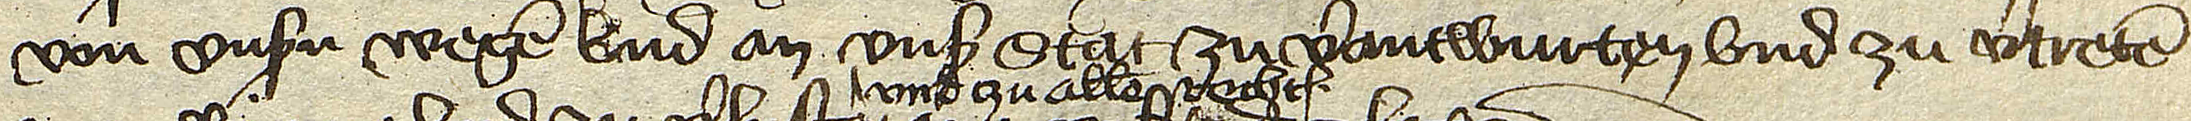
von vnſ*n wege* vnd an vnſ* Stat cʒu v*antwurten vnd cʒu v*trete*
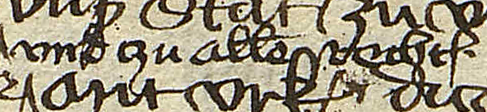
vnd cʒu alle recht*
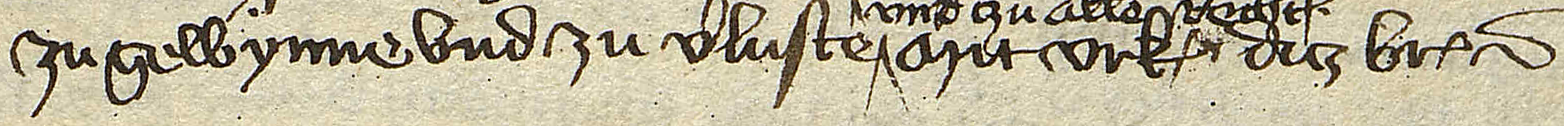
cʒu gewynne vnd cʒu v*luſte Mit vrk* dicʒ br* ec*
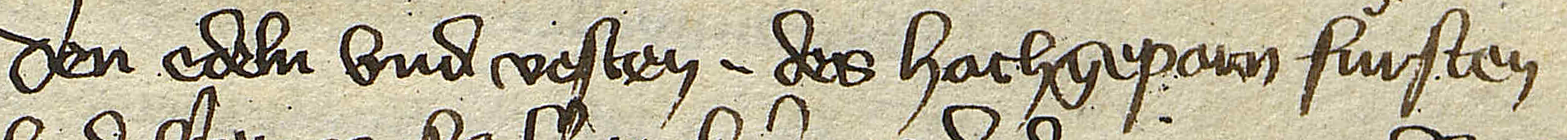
den edeln vnd veſten ~ des hochgeporn fürſten
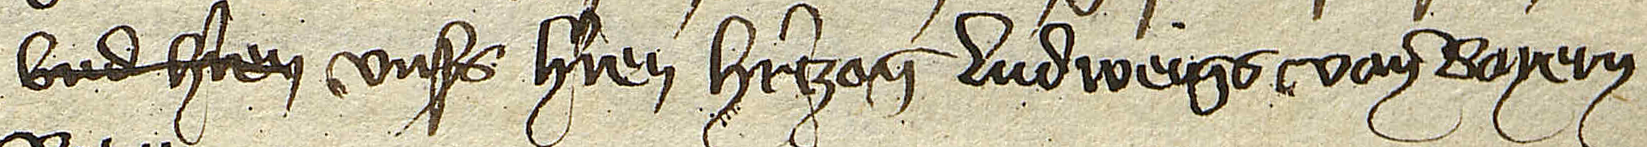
vnd h*ren vnſ*s h*ren h*rcʒog Ludweigs von Bayern
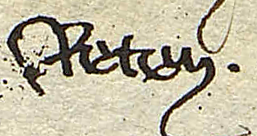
Reten.
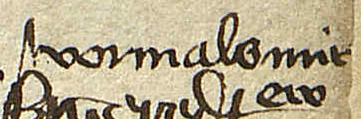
vormals mit
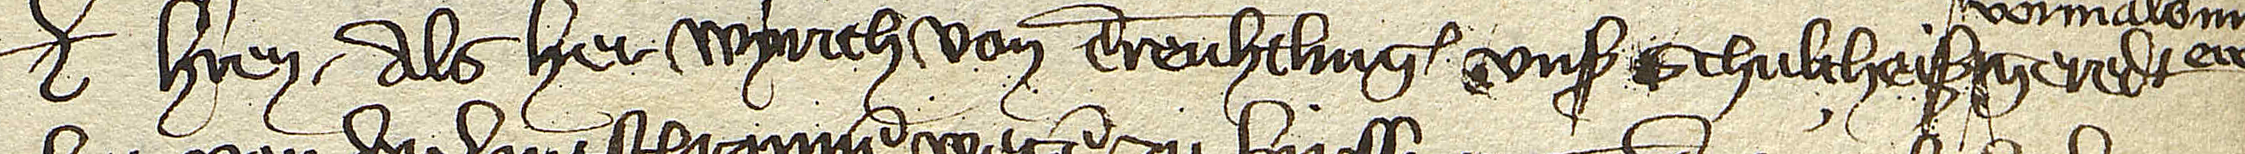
L* h*ren / Als her wyrich von Treuhtling* vnſ* Schultheiſʒ geredt
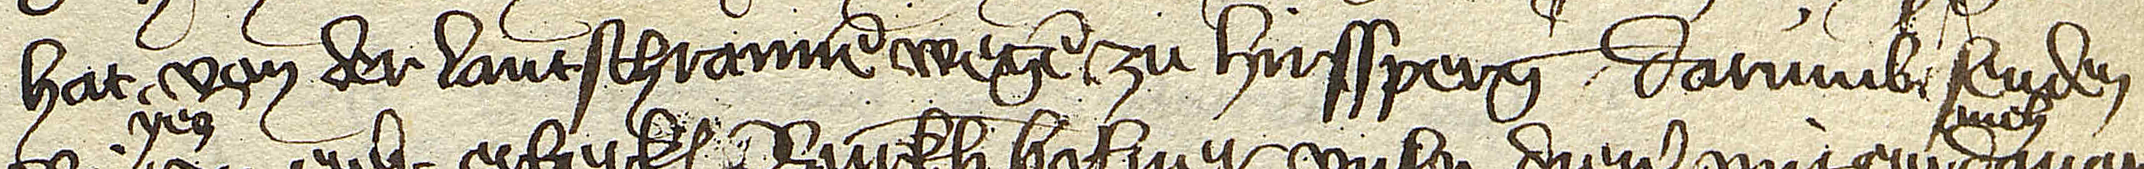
hat / von der lantſchranne* wege* cʒu hirſſperg / darumb ſenden
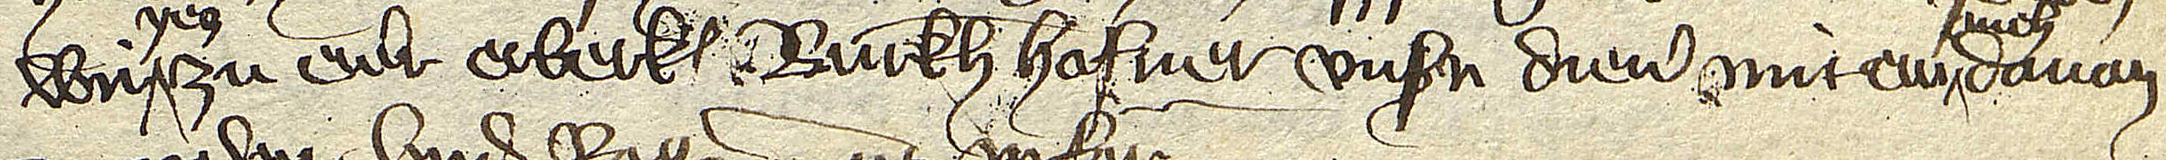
wir cʒu ew*r erberk* / Burkh* hofner vnſ*n dien* mit ew dauon
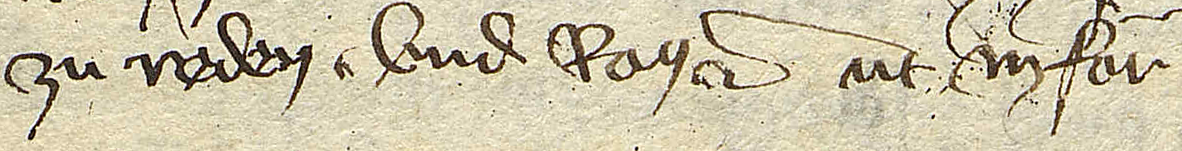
cʒu reden / vnd Ro* ec* ut in for*
